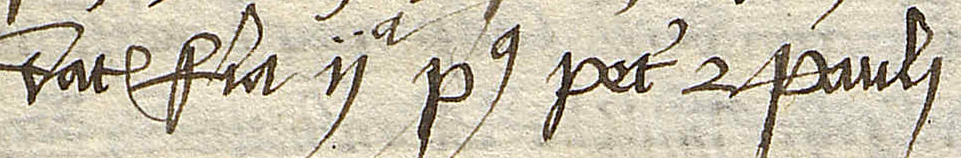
Dat* fi*a ii* P* Pet* @ Pauli
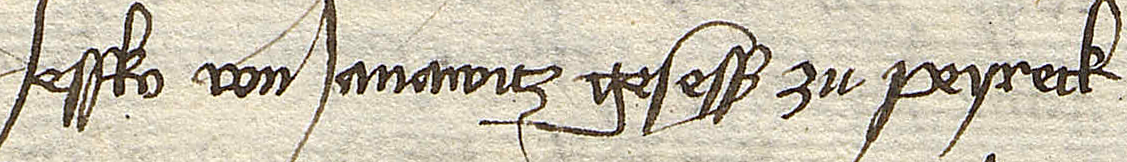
Ieſſko von Ianawicʒ geſeſſ* ʒu Peyreck
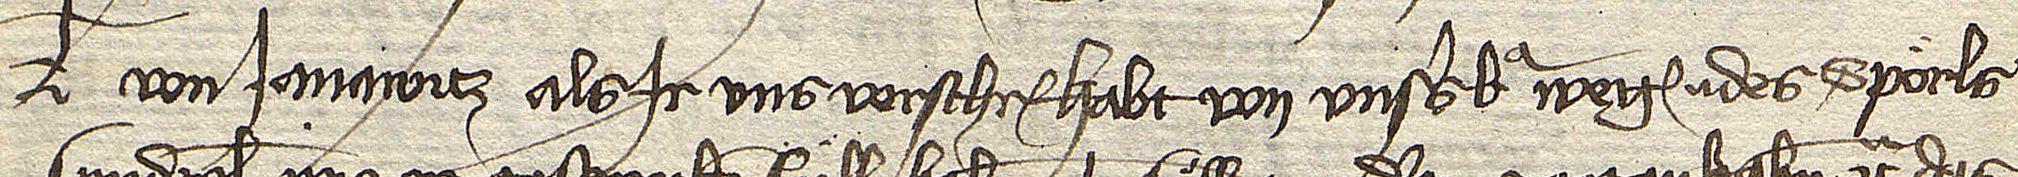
L* von Ianawicʒ als Ir vns verſchr* habt von vnſ*s b* weg* ~ des Spörls
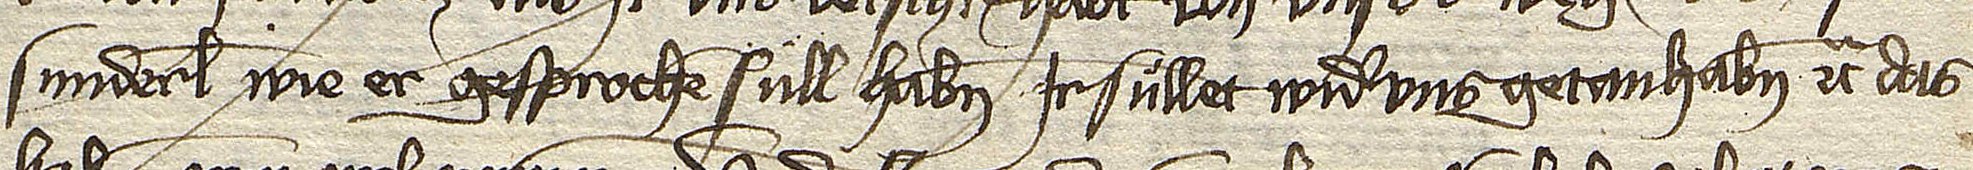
ſundel* wie er geſproche* ſüll habn* Ir ſüllet wid* vns getan habn* ec* das
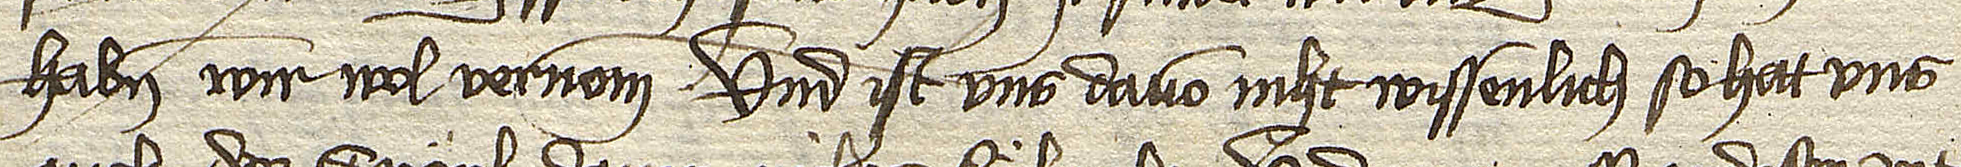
habn* wir wol vernom* . Vnd iſt vns dauo* niht wiſſenlich ſo hat vns
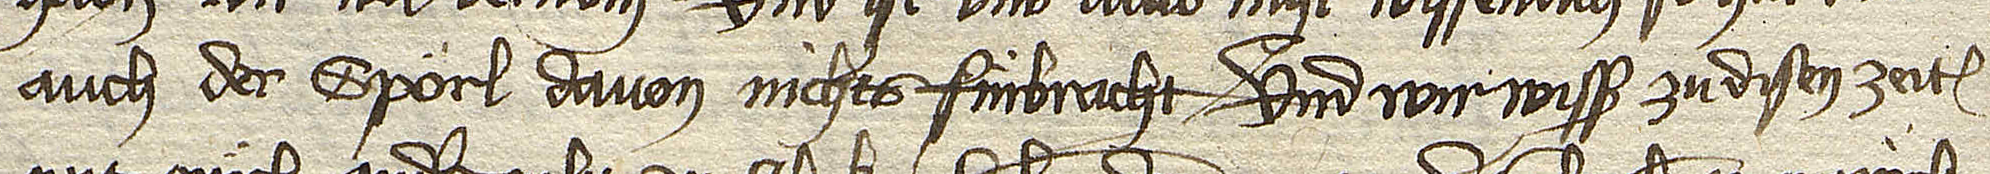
auch der Spörl dauon nichts fürbracht / Vnd wir wiſſ* ʒu diſen ʒeit*
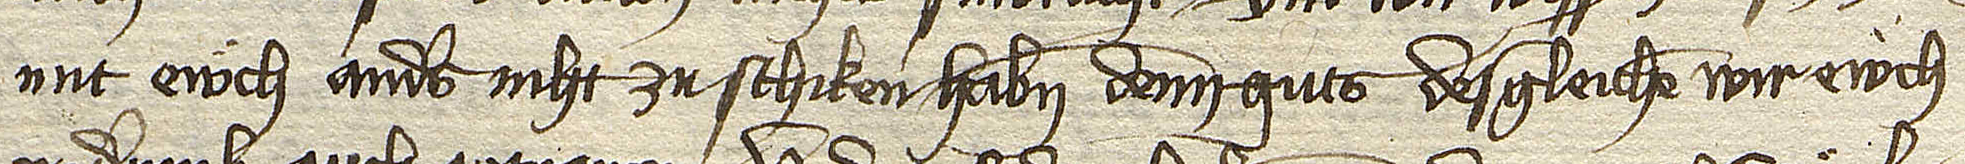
mit eẅch and*s niht ʒu ſchiken habn* denn guts deſgleiche* wir eẅch
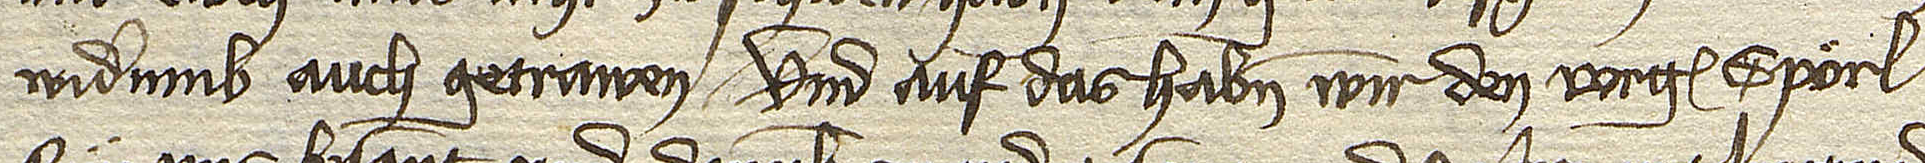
wid*umb auch getrawen / Vnd auf das habn* wir den vorg* Spörl
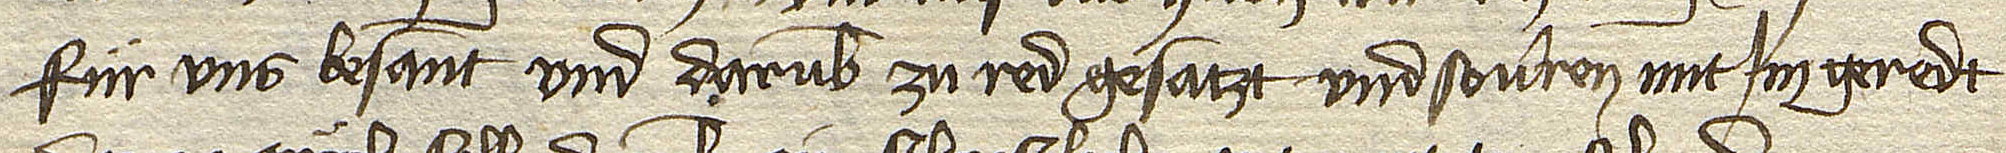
für vns beſant vnd darub* ʒu red geſacʒt vnd ſou*ren mit Im geredt
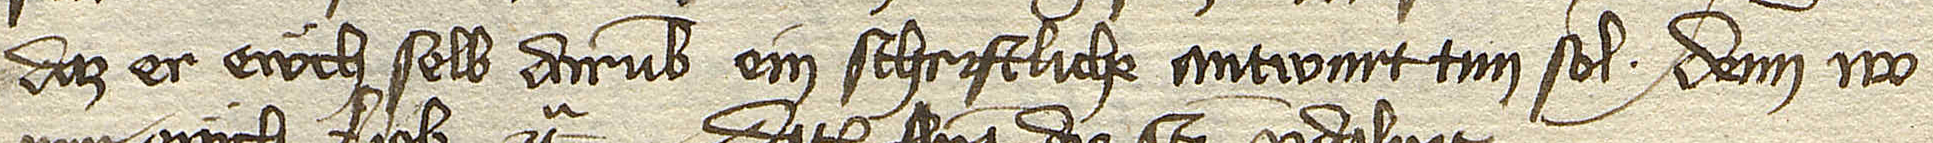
daʒ er eẅch ſelb darub* ein ſchriftliche antwurt tun ſol . Denn wo
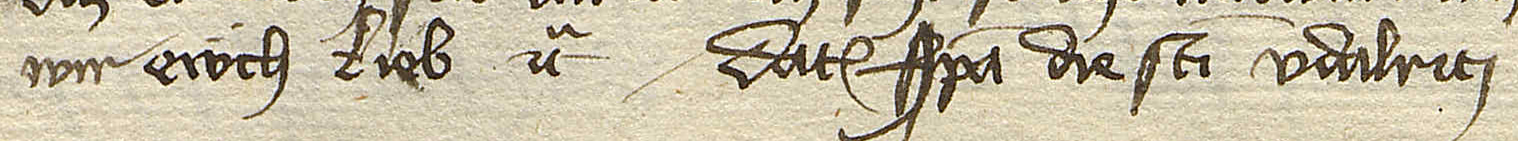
wir eẅch lieb ec* / Dat* Ipa* die ſci* vdalrici
